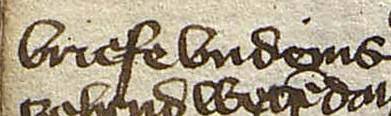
briefe vnd eins
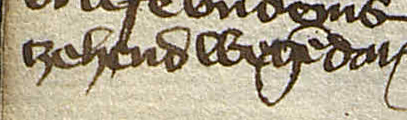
cʒehend wege* dar*
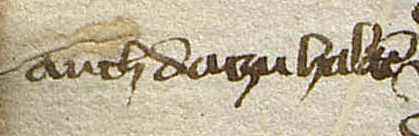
auch darcʒu halte*
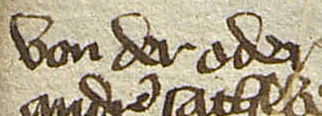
von der oder
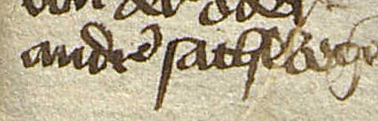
andr* ſach wege*
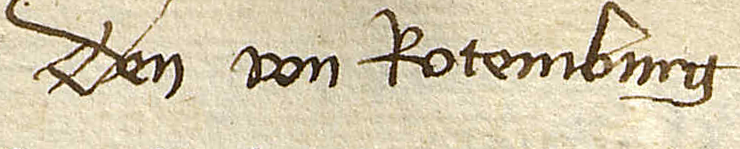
Den von Rotemburg
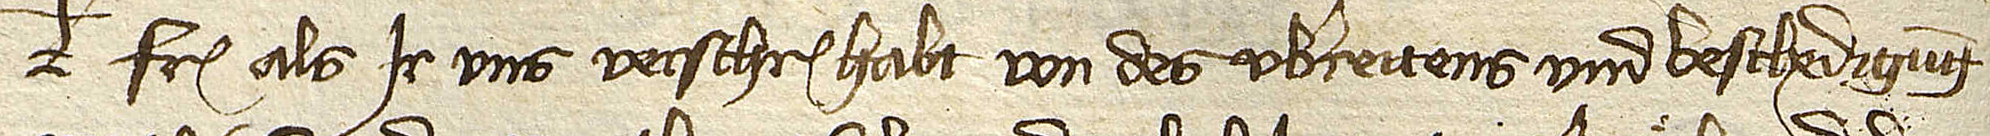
L* fr* als Ir vns verſchr* habt von des vb*reitens vnd beſchedigu*g
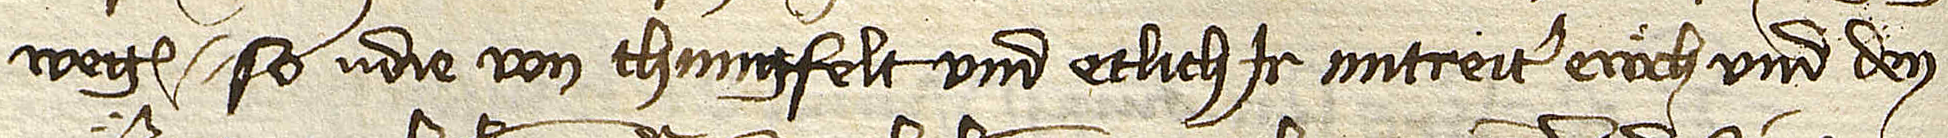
weg* / ſo ~ die von thungfelt vnd etlich Ir mitreit* eẅch vnd den
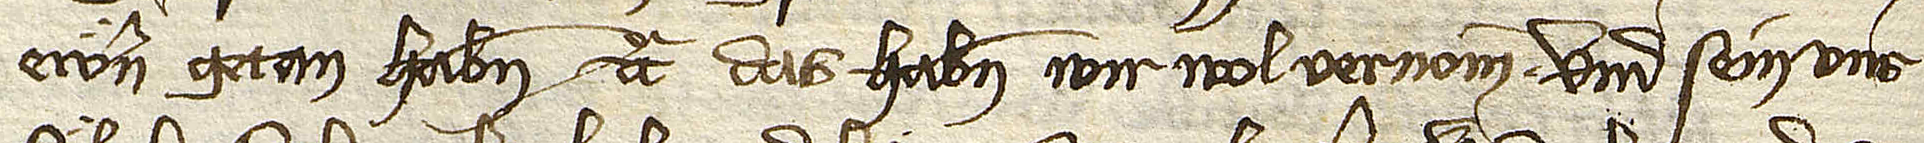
eẅ*n getan habn* ec* das habn* wir wol vernom* / Vnd ſein vns
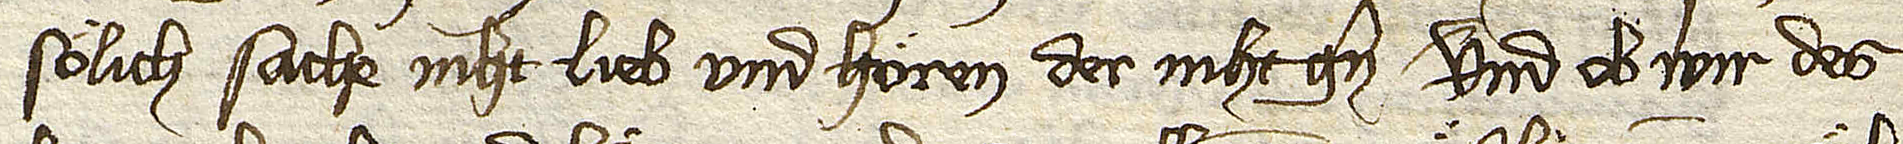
ſölich ſache niht lieb vnd hören der niht g*n / Vnd ob wir des
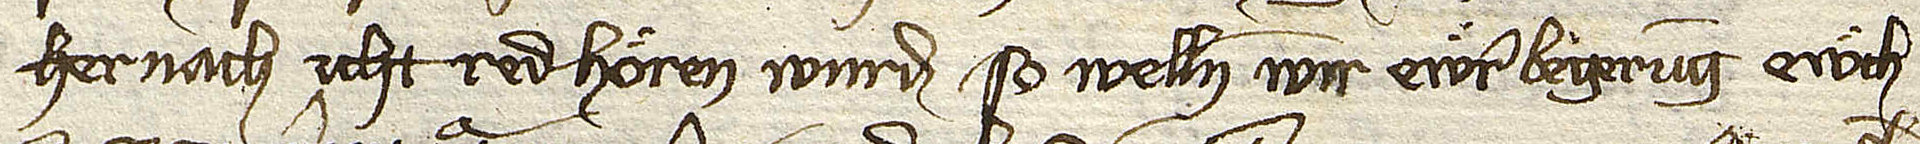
her nach icht red hören wurd* / ſo welln* wir eẅr* begeru*g eẅch
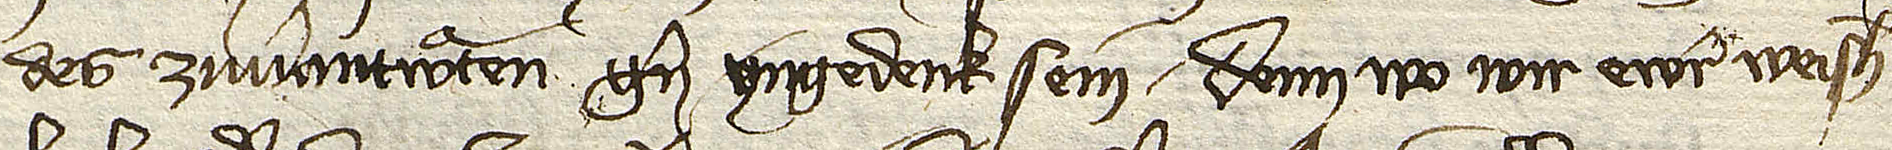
des ʒuu*antw*ten g*n yngedenk ſein / Denn wo wir ewr* weiſh*
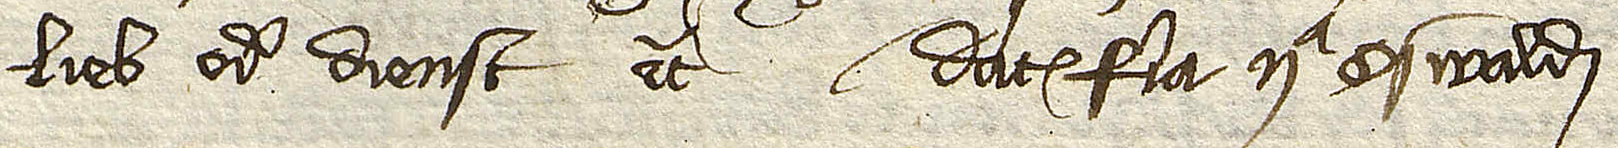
lieb od* dienſt ec* / Dat* fi*a ii* Oſwaldi
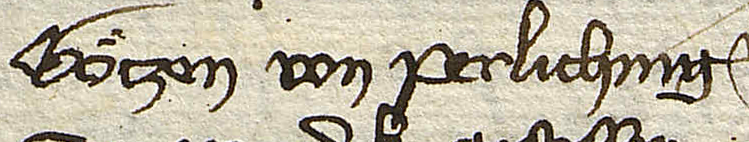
Göcʒen von Perliching*
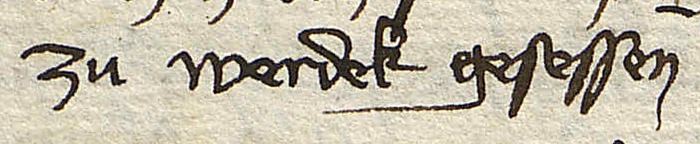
ʒu Werdek geſeſſen
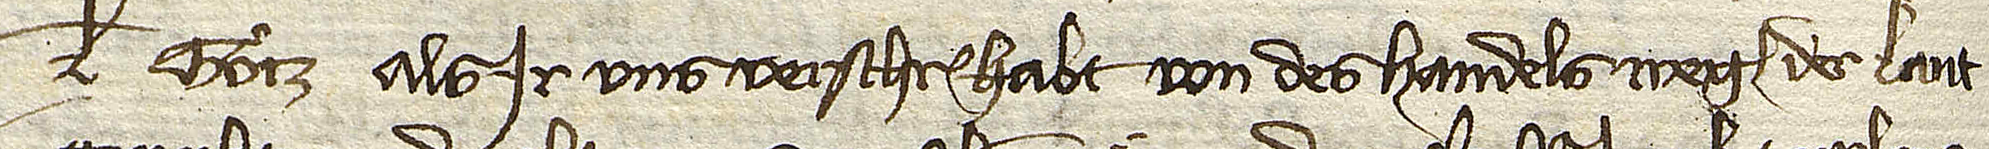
L* Göcʒ als Ir vns verſchr* habt von des handels weg* der lant
